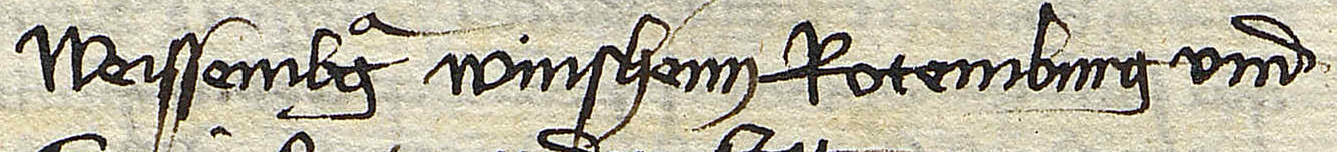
Weiſſemb*g winſheim Rotemburg vnd
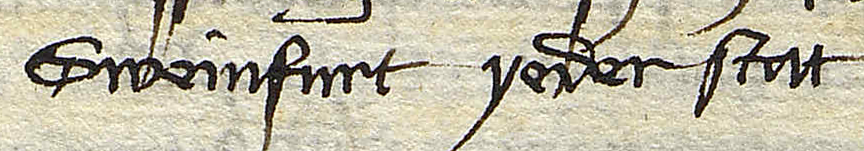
Sweinfurt yeder stat
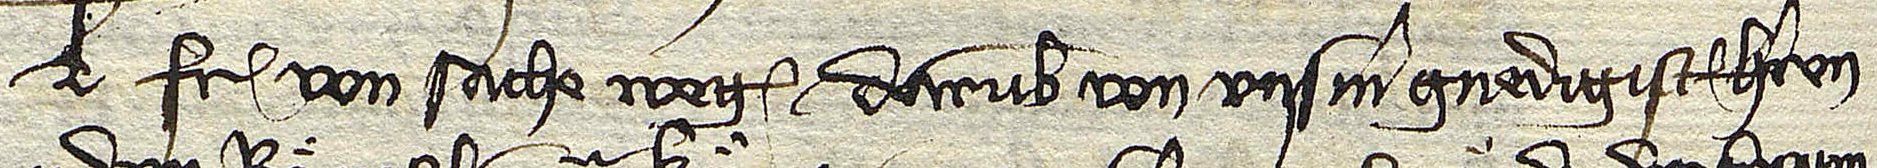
L* fr* von ſache weg* / daru*b von vnſ*m gnedigiſt* h*ren
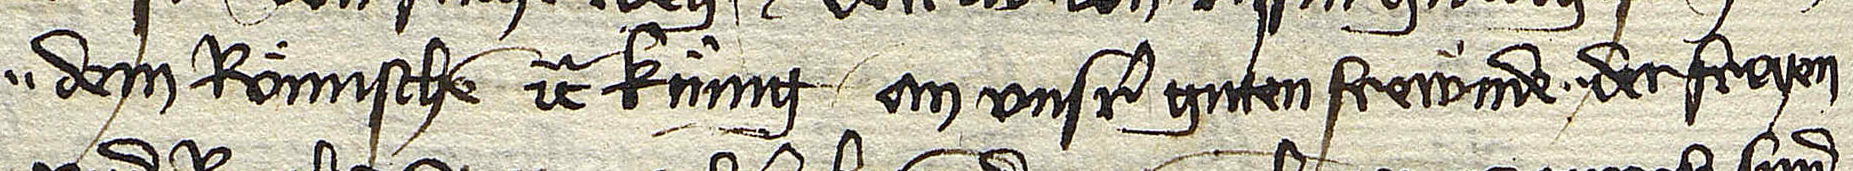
~ dem Römiſche* ec* Künig / an vnſr* guten frewnde ~ der freyen
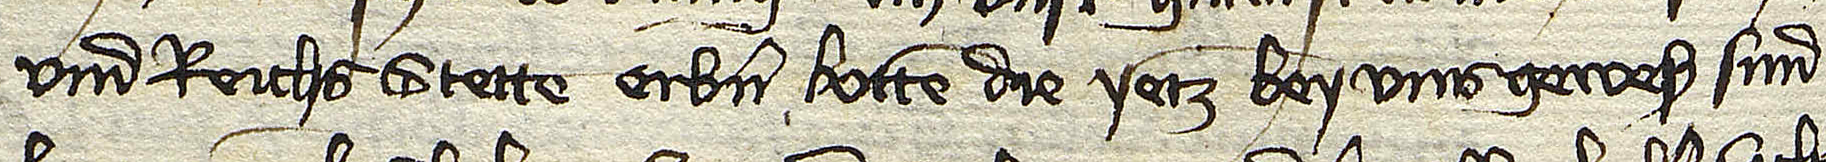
vnd Reichs Stette erb*n botte* die yecʒ* bey vns geweſ* ſind
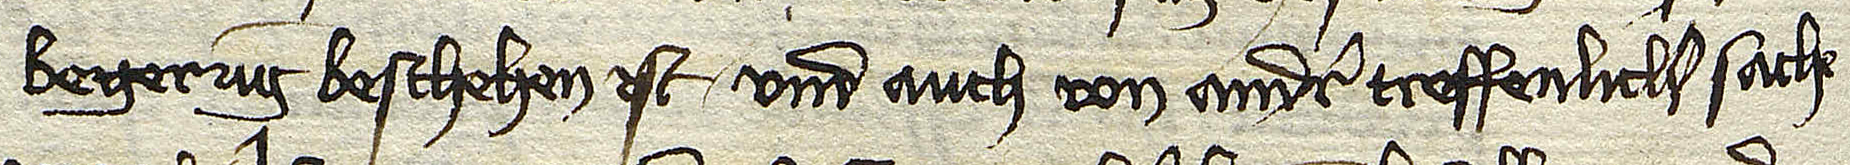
begeru*g beſthehen iſt / vnd auch von andr* treffenlich* ſache
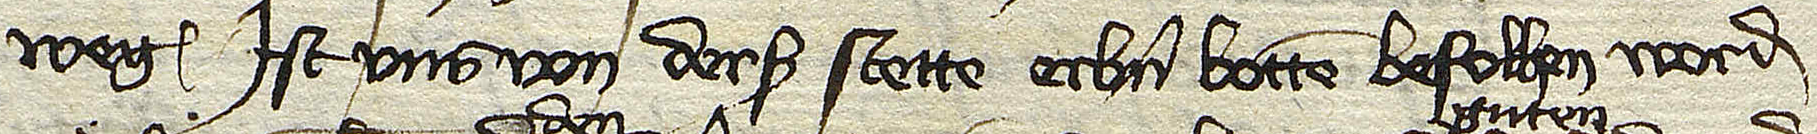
weg* / Iſt vns von derſ* ſtette erb*n botte* befolhen word*
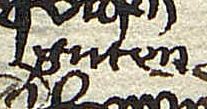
guten
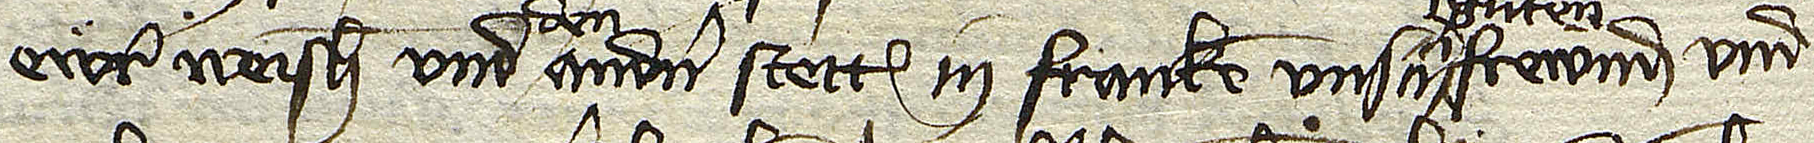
ewr* weiſh* vnd and*n ſtett* in franke* vnſ*n frewnd* vnd
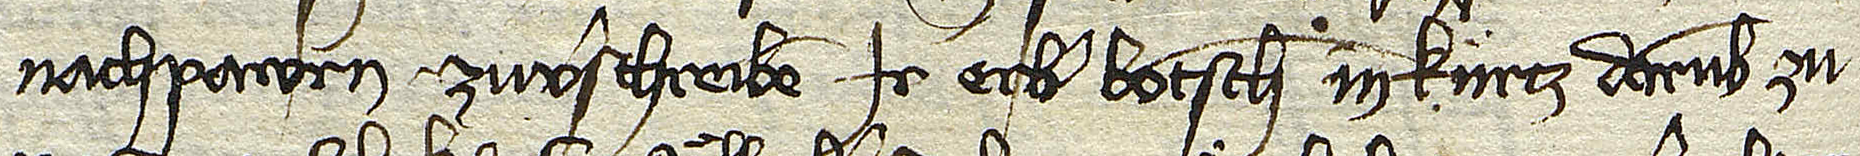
nachpawrn / ʒuv*ſchreibe* Ir erb* botſch* in kürcʒ darub* ʒu
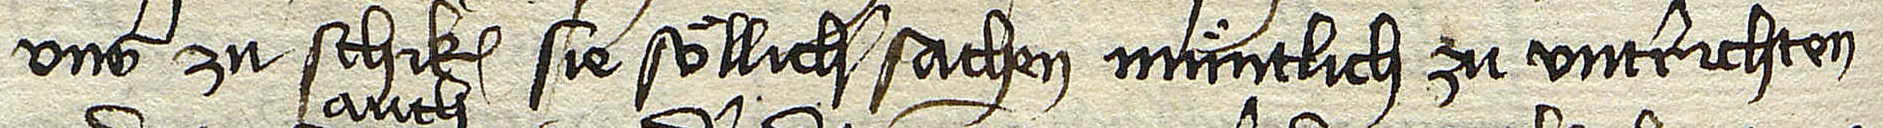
vns ʒu ſchik* ſie ſöllich* ſachen müntlich ʒu vnt*richten
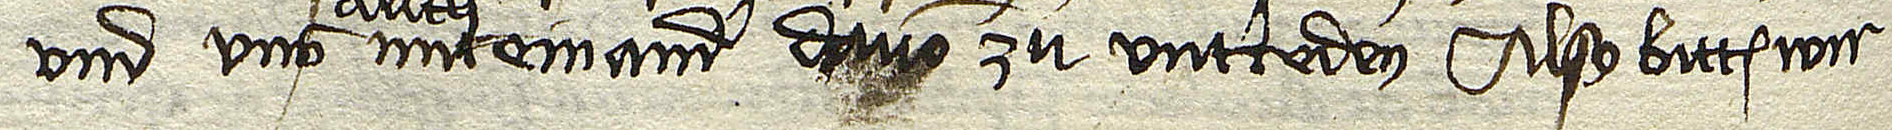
vnd vns miteinand* dauo* ʒu vnt*reden Also bitt* wir
